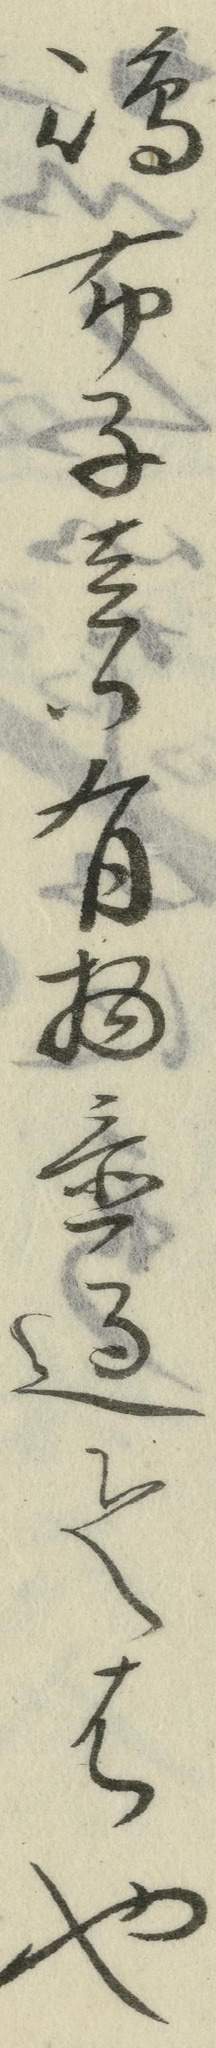嶋布子壱ツ有物置過てはや
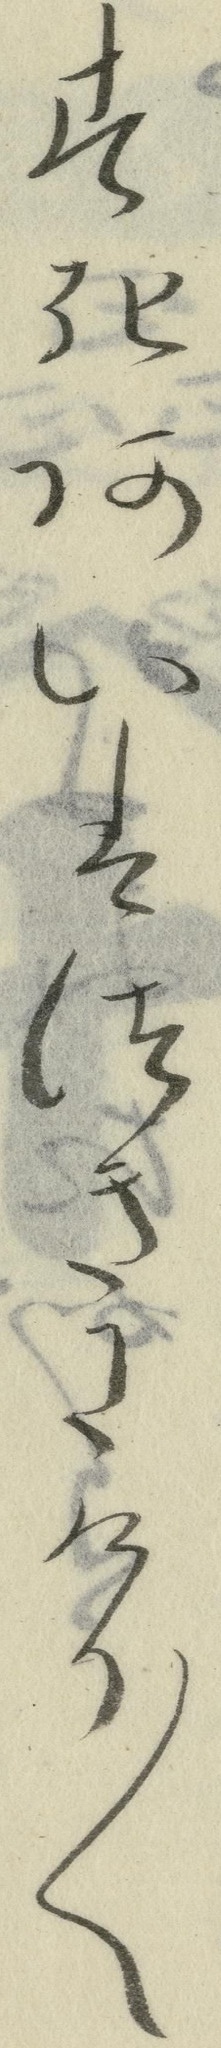す化あいはつきて取り〳〵
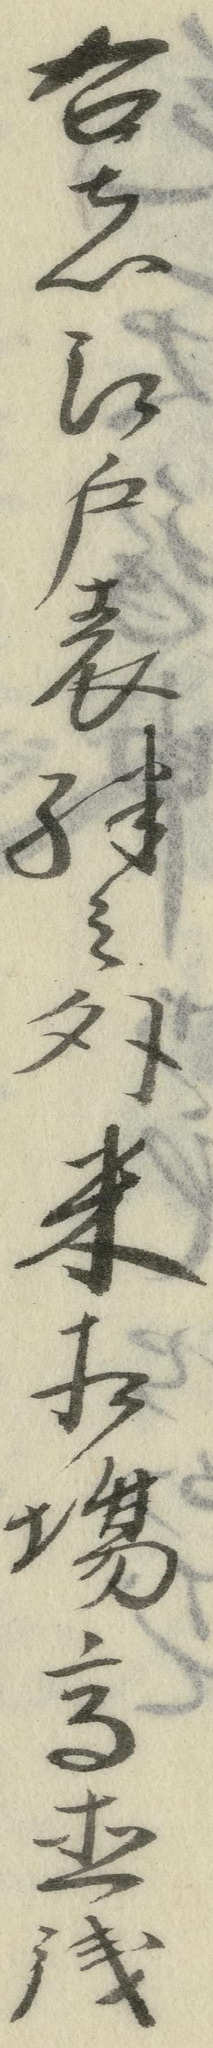右者江戸表殊之外米相場高直浅
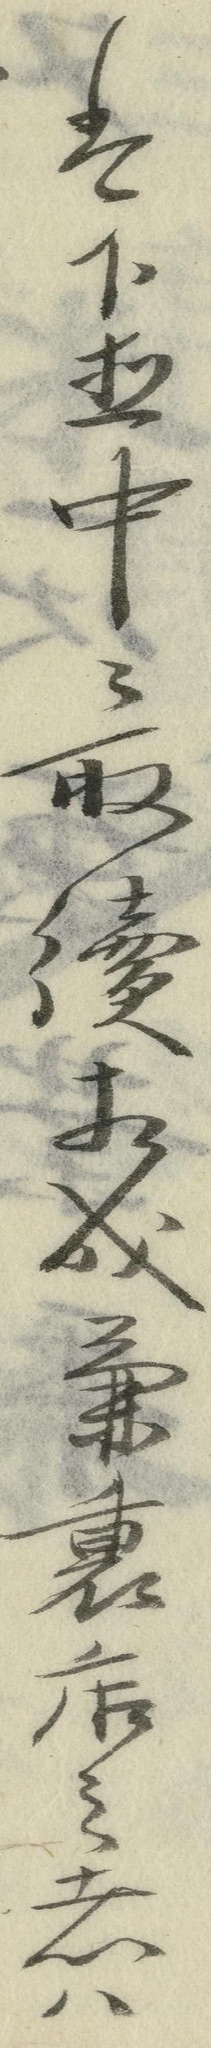は下直中々取続相成兼裏店之者は
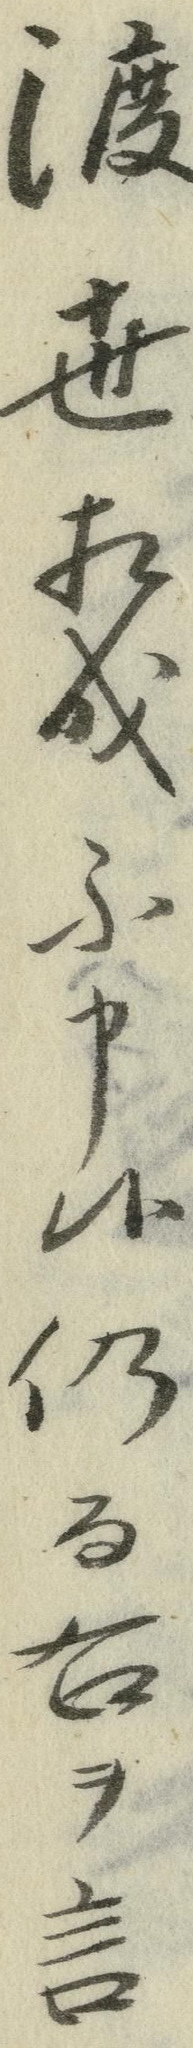渡世相成不申候仍而右ヲ言

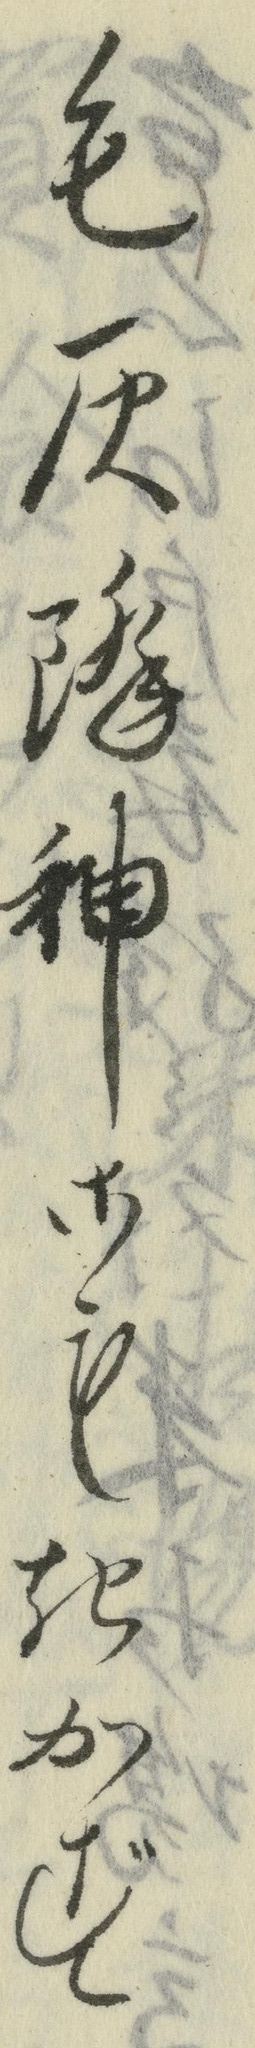毛灰降神御もきかず
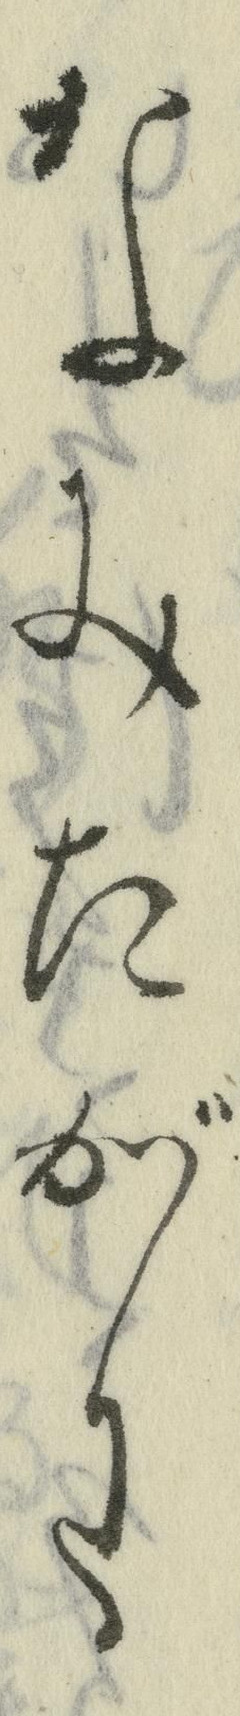なみたがて
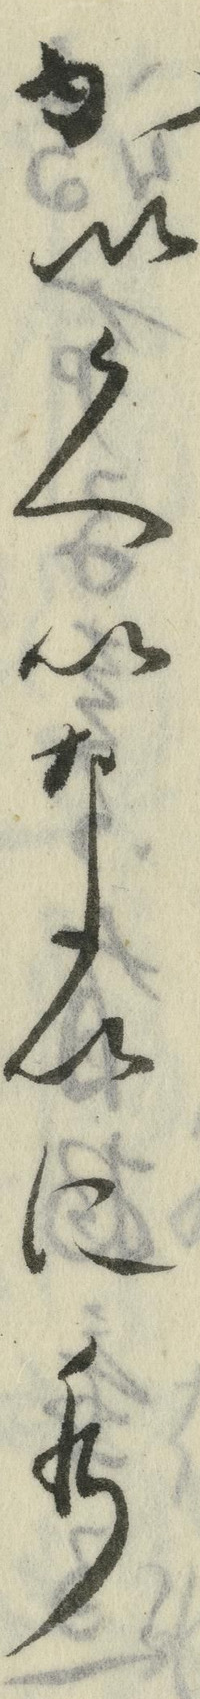かいくいないに水
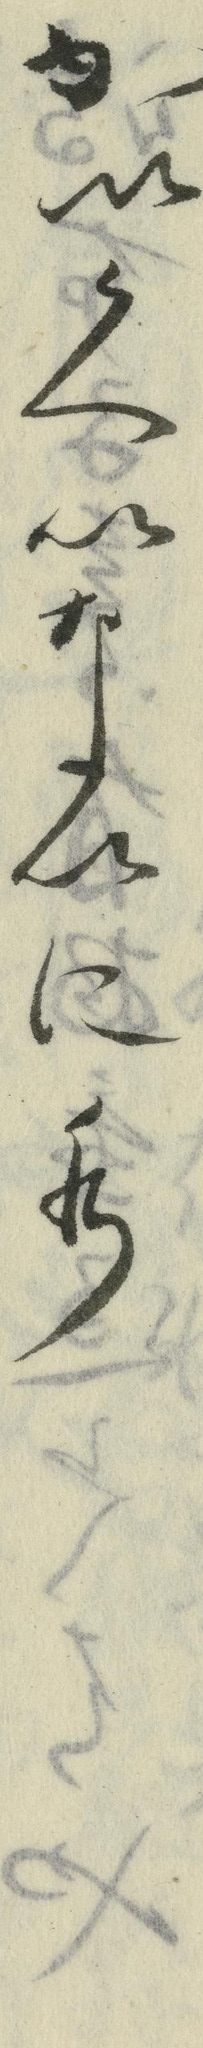かいくいないに水
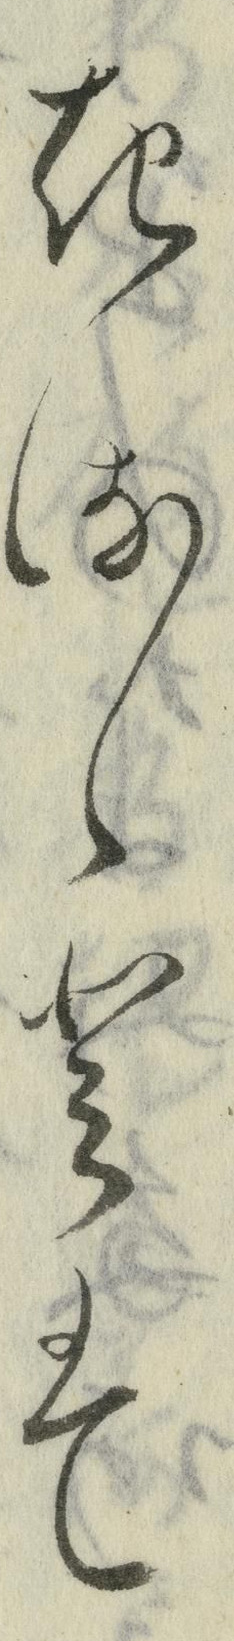きまゝとは
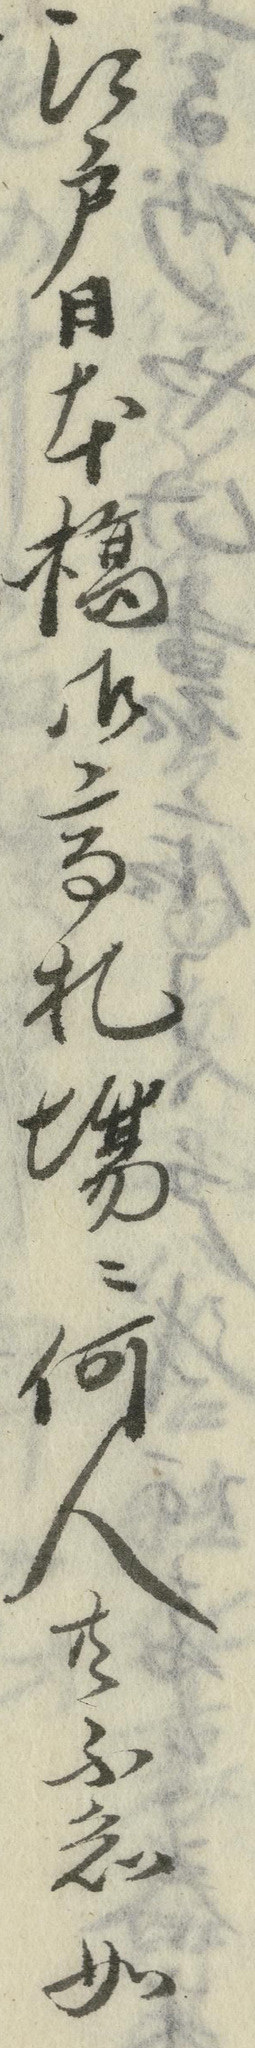江戸日本橋御高札場ニ何人共不知如
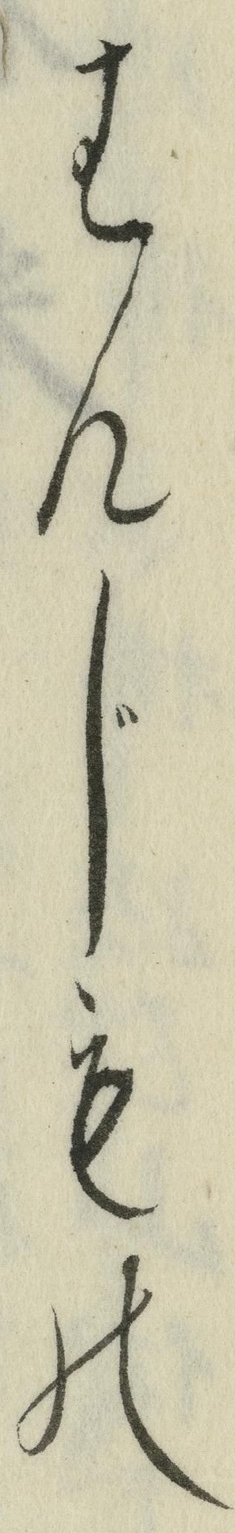はんじもの

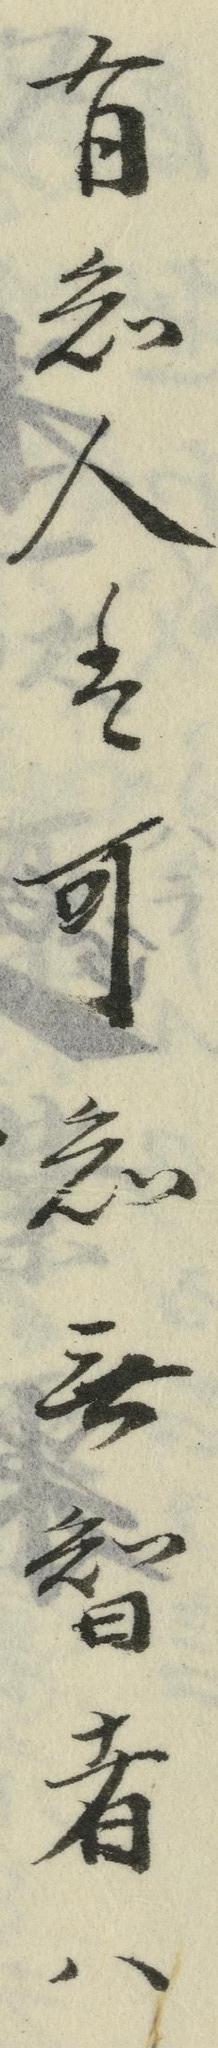有知人は可知無智者は
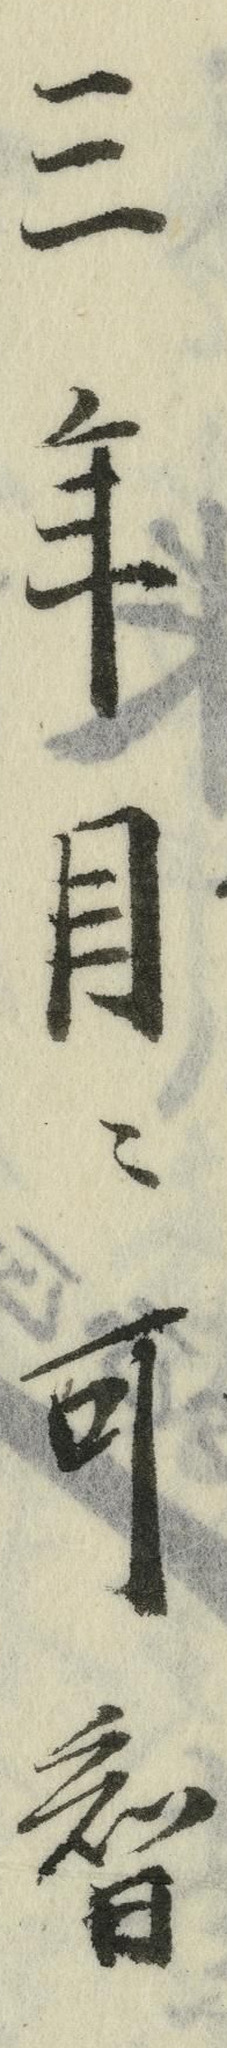三年目ニ可智
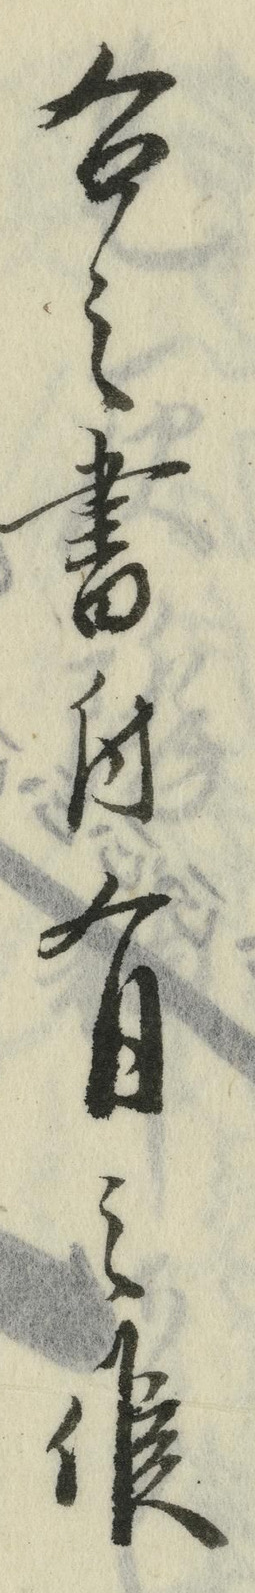右之書付有之候
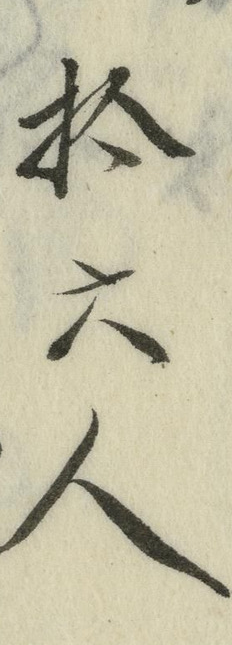正正拾六人
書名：天明三癸卯七月信州浅間山焼出シ上州山津浪ニ付近國ヨリ御届書并訴書写
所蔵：東京大学地震研究所図書室 Earthquake Research Institute Library, The University of Tokyo, JAPAN
